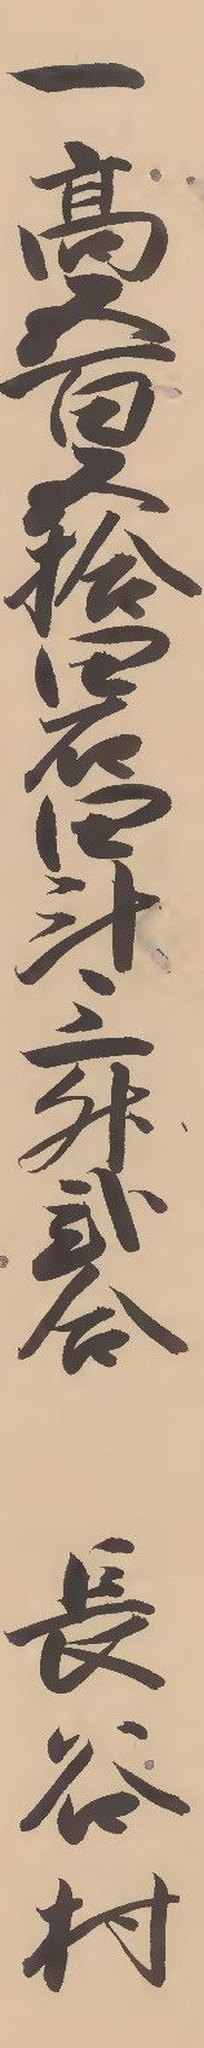一高五百五拾四石四斗三升弐合長谷村
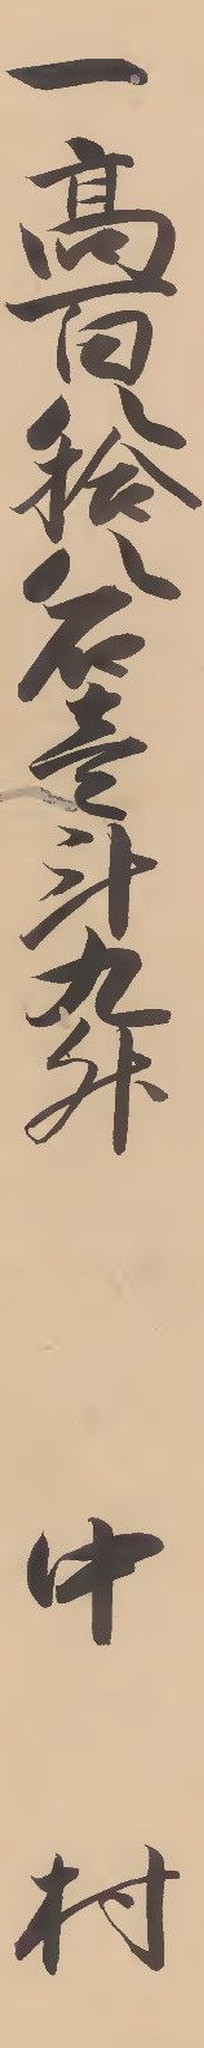一高百八拾八石壱斗九升中村

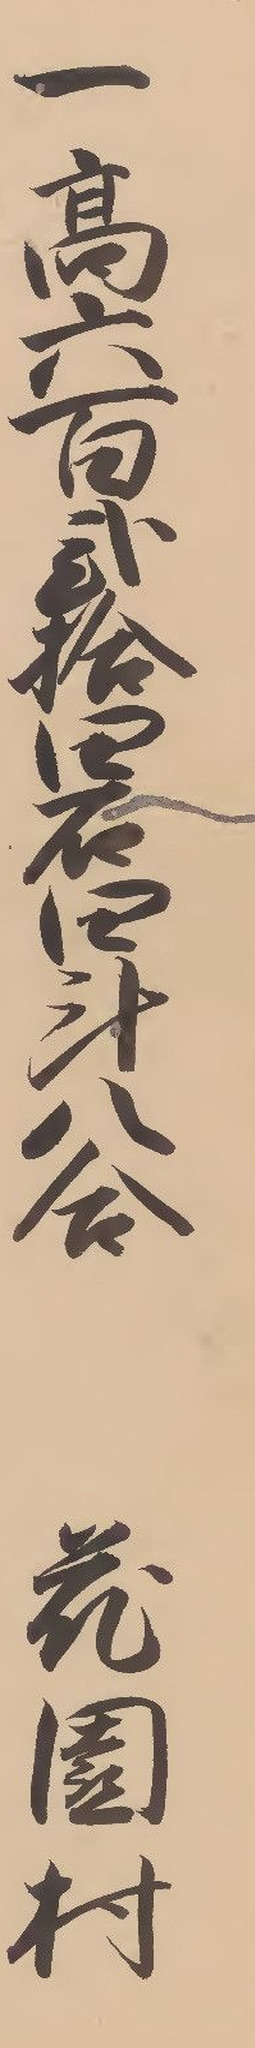一高六百弐拾四石四斗八合花園村
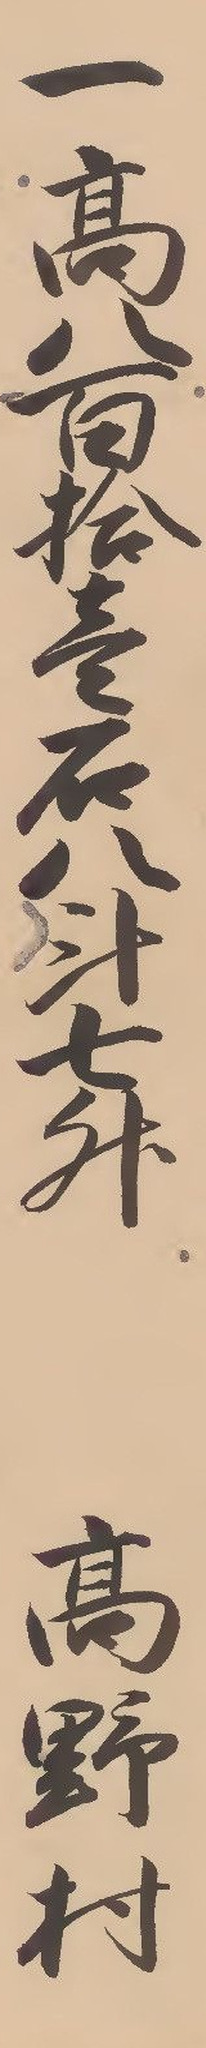一高八百拾壱石八斗七升高野村
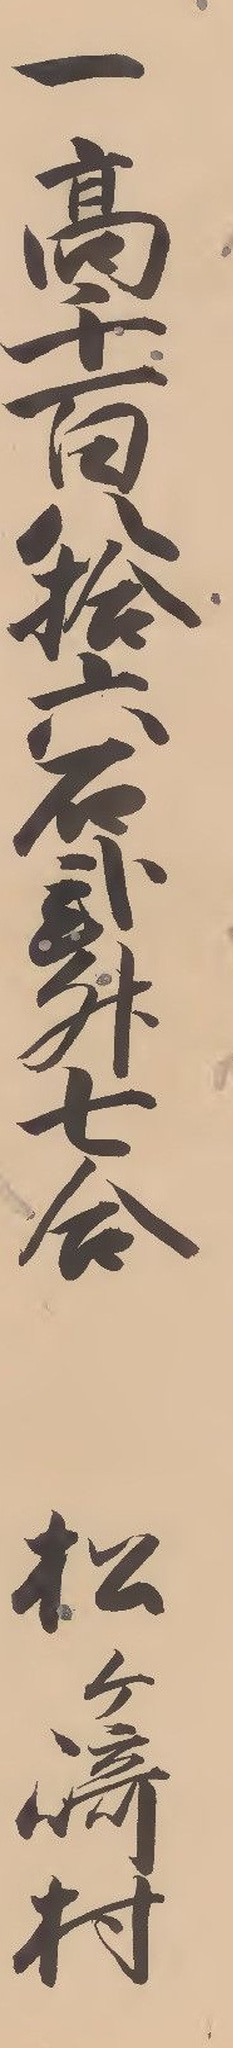一高千百八拾六石弐升七合松ヶ崎村
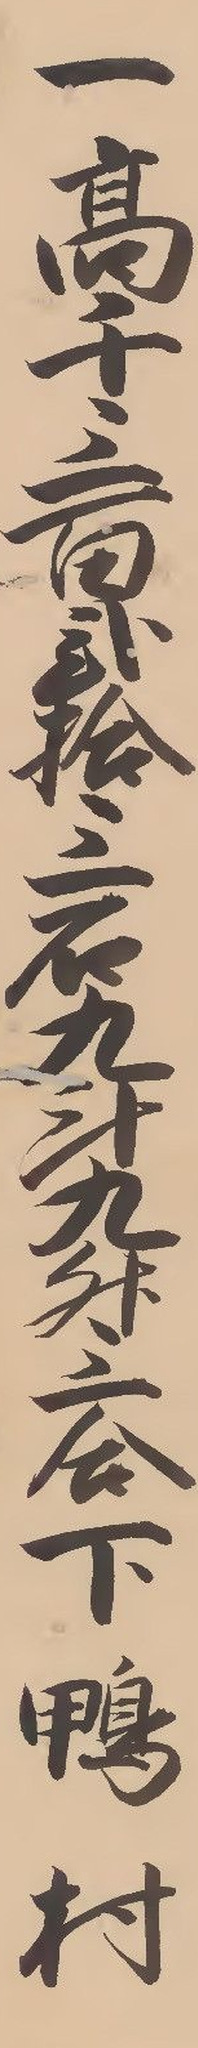一高千三百弐拾三石九斗九升三合下鴨村
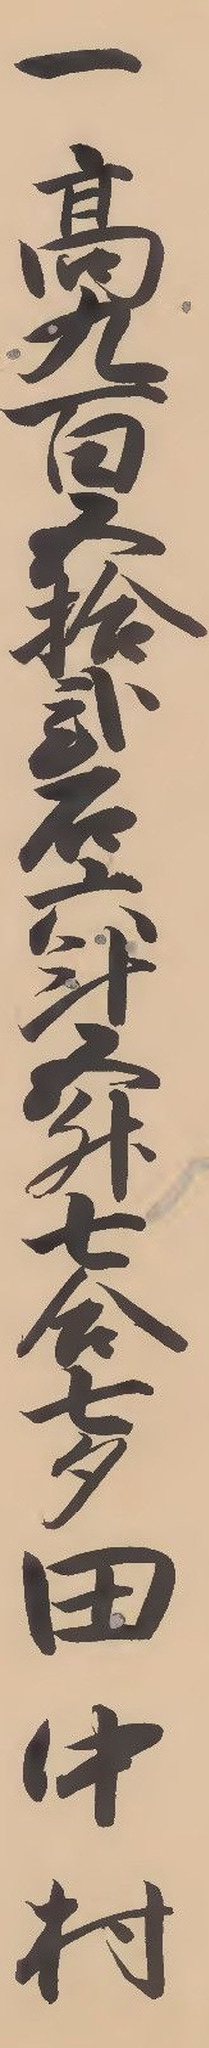一高九百五拾弐石六斗五升七合七勺田中村
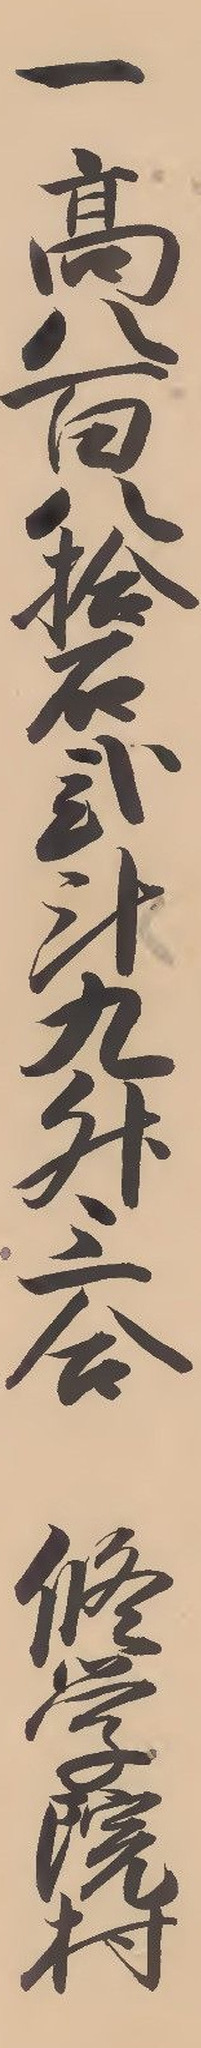一高八百八拾石弐斗九升三合修学院村
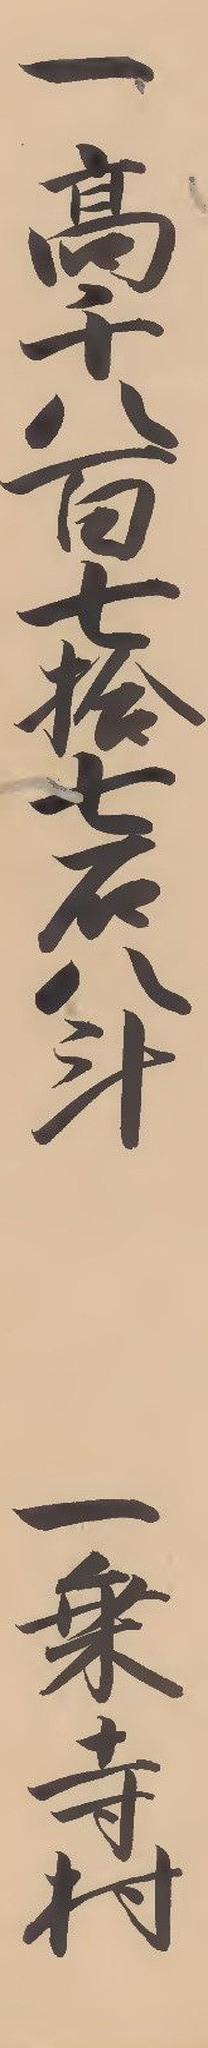一高千八百七拾七石八斗一乗寺村

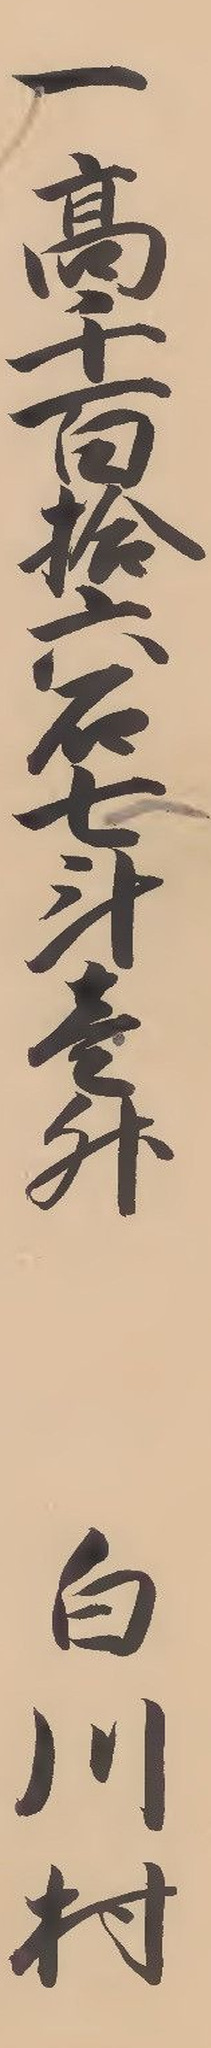一高千百拾六石七斗壱升白川村
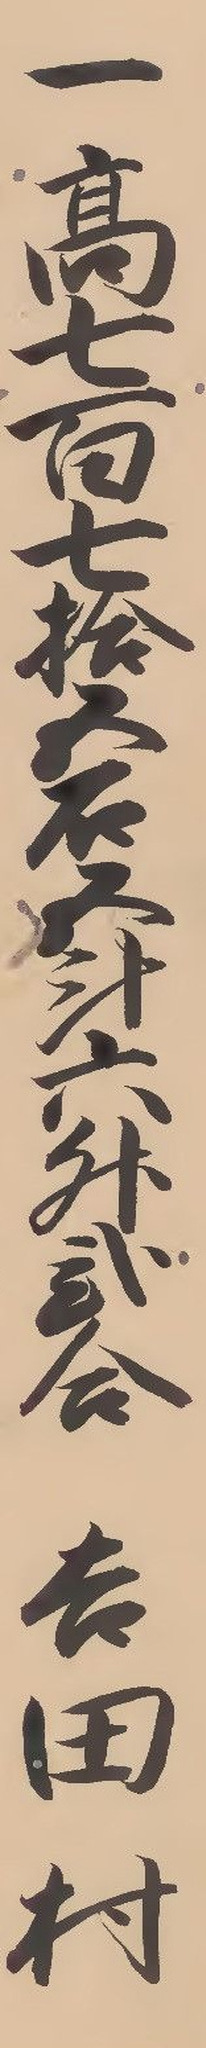一高七百七拾五石五斗六升弐合吉田村
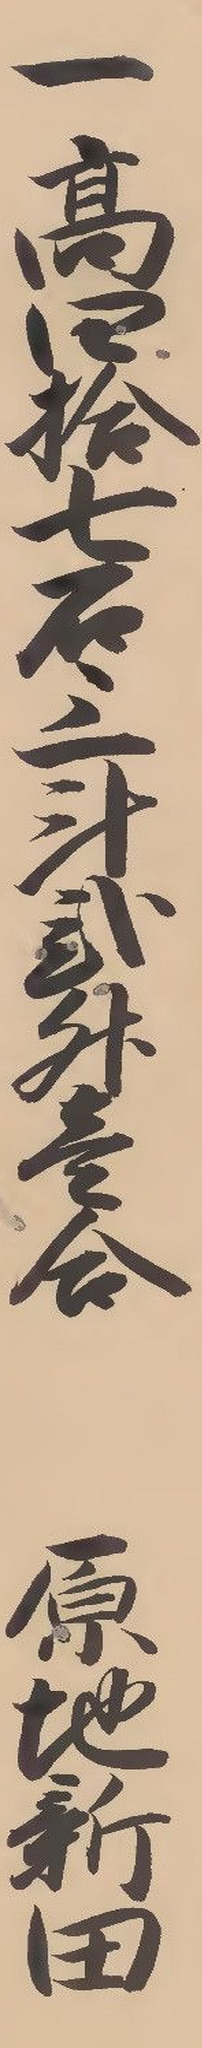一高四拾七石三斗弐升壱合原地新田
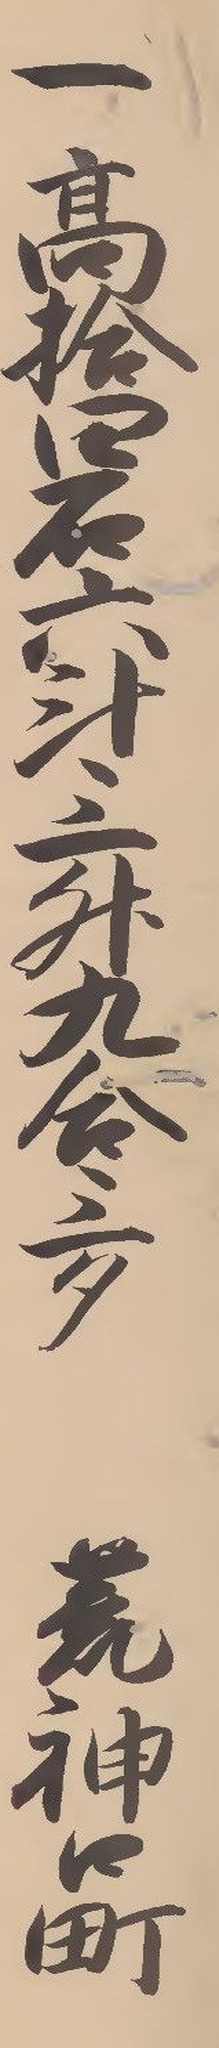一高拾四石六斗三升九合三尺荒神口町
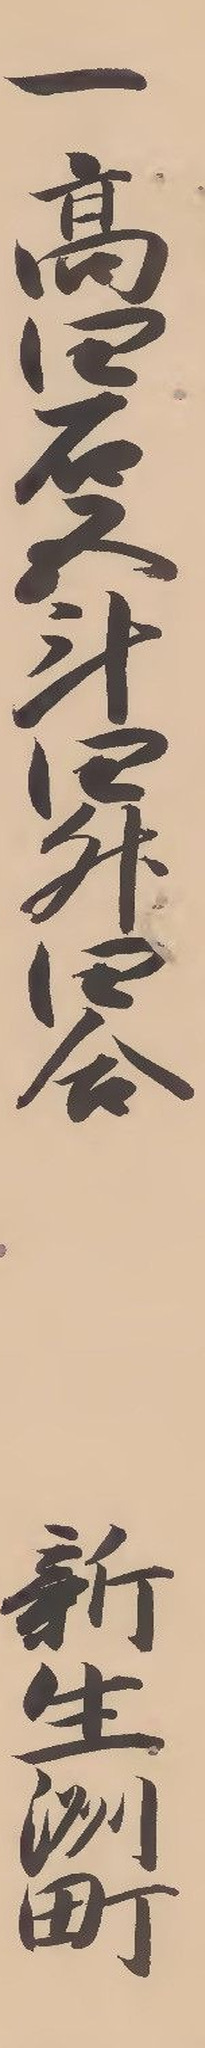一高四石五斗四升四合新生洲町
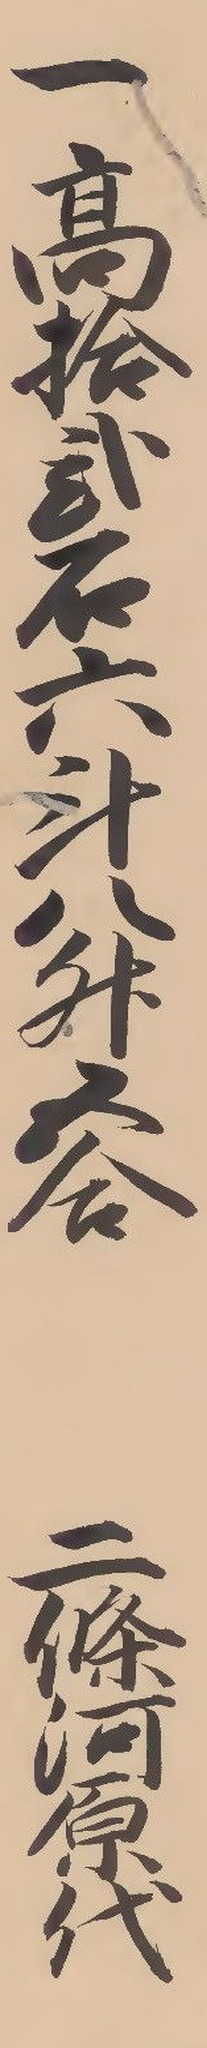一高拾弐石六斗八升五合二条河原代

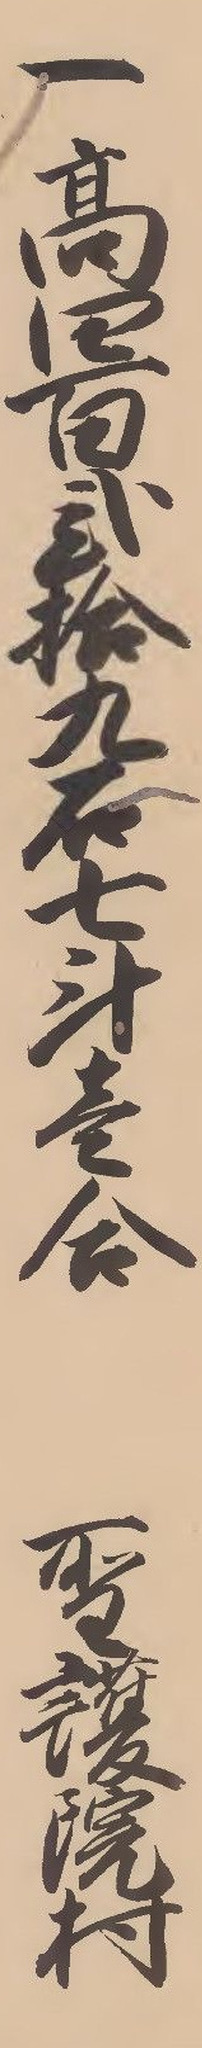一高四百弐拾九石七斗壱合聖護院村
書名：山城国郷帳
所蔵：国立公文書館 National Archives of Japan
